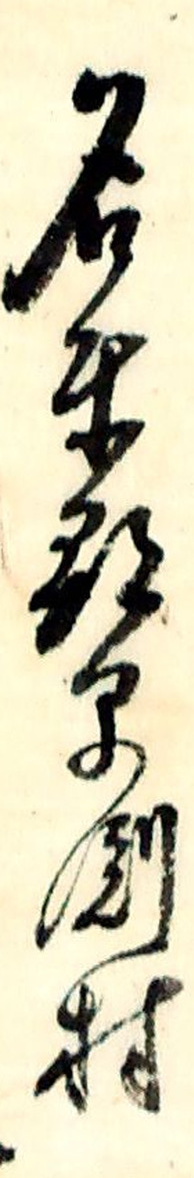名東郡早淵村
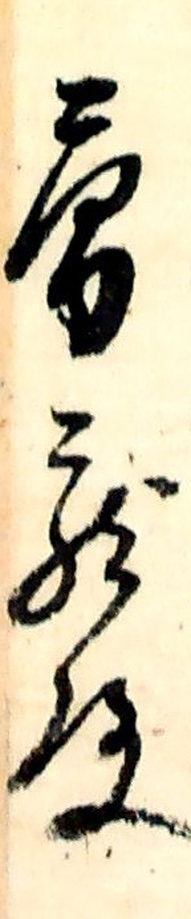勇蔵殿
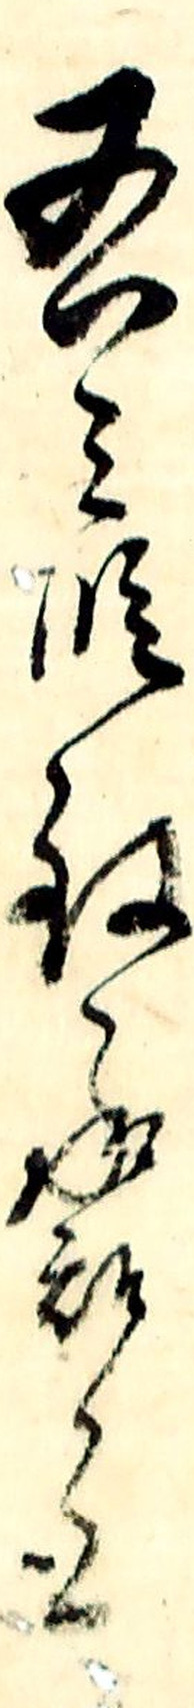右之段致承知候以上
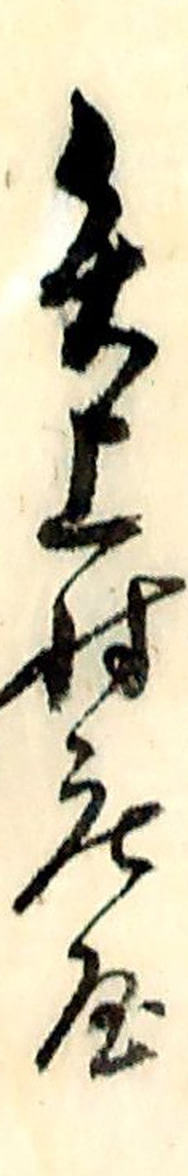矢上村庄屋
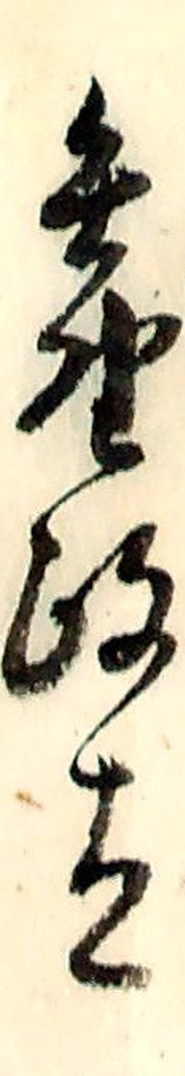矢野政太
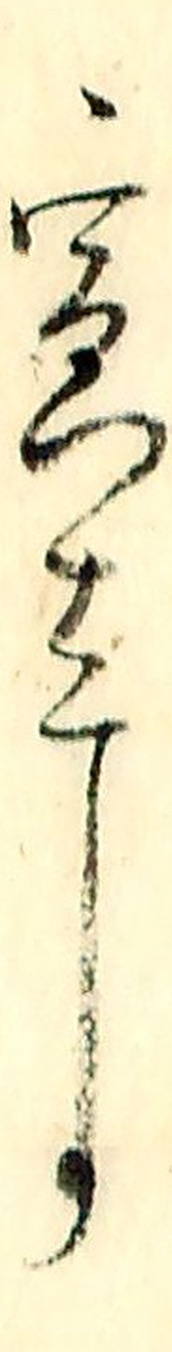寅十二月
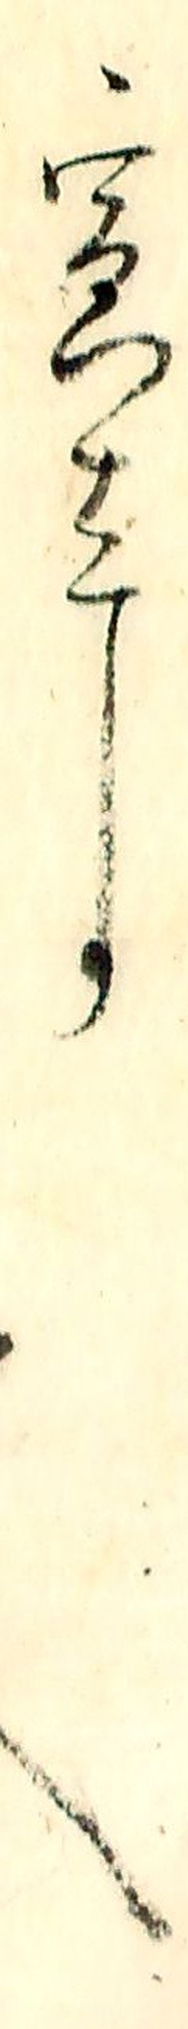寅十二月
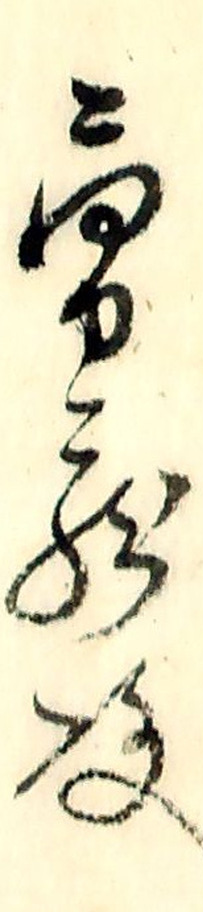勇蔵殿
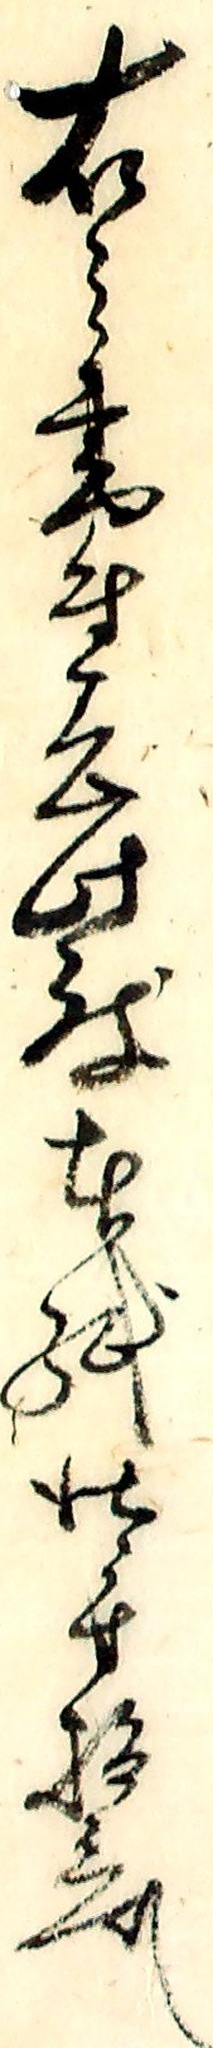右之書付は此度奉紙仕候付指上
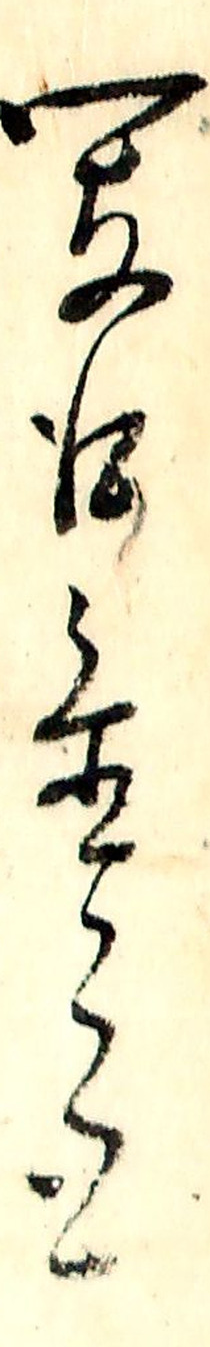写取置候以上
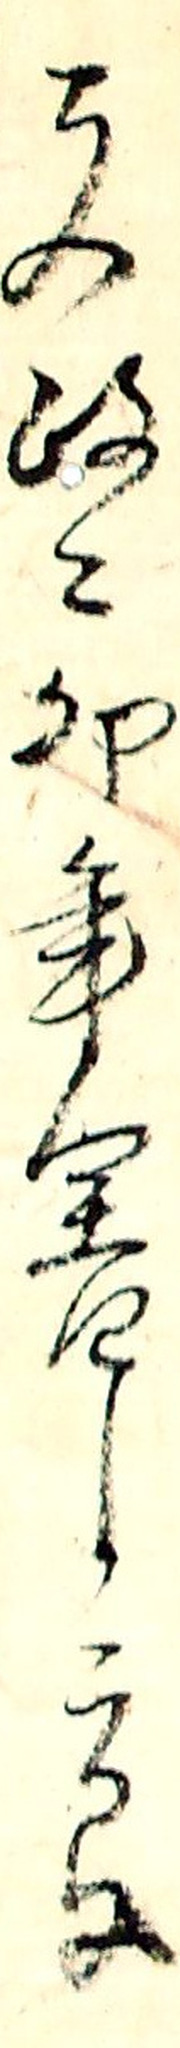文政二卯年閏四月二日
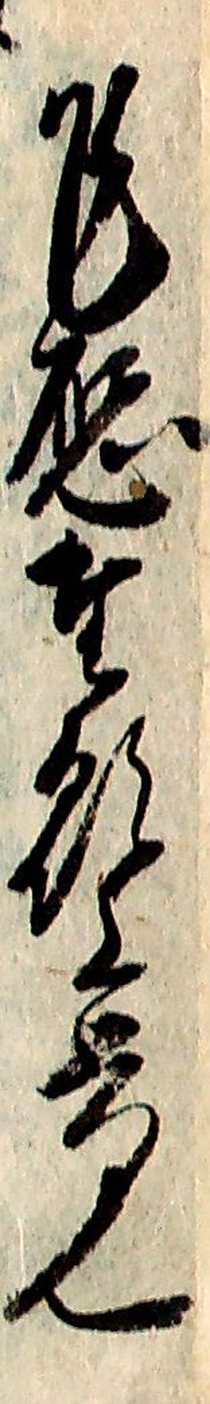乍恐奉願上覚
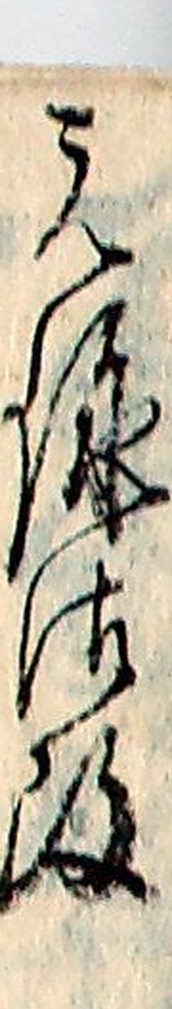元禄御改
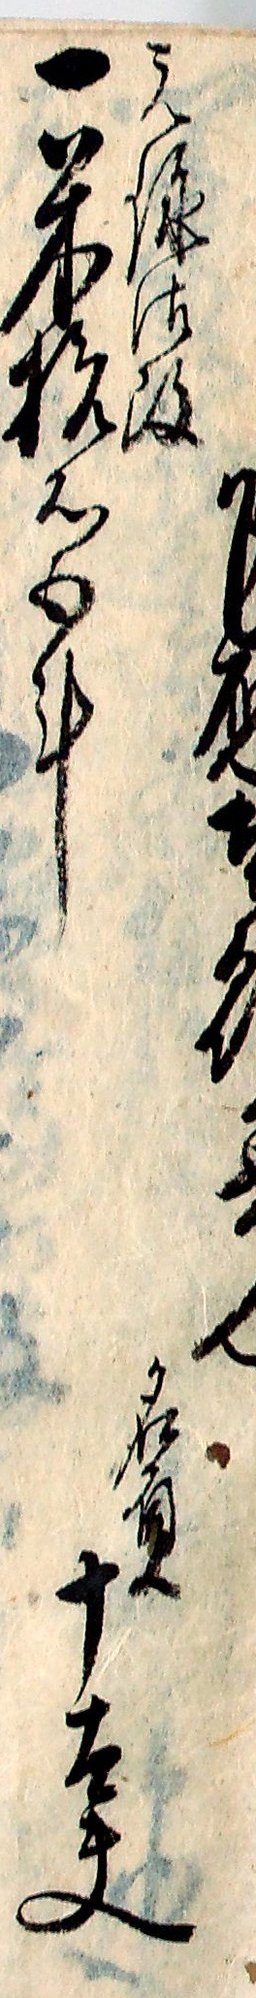一米拾石五斗十太夫
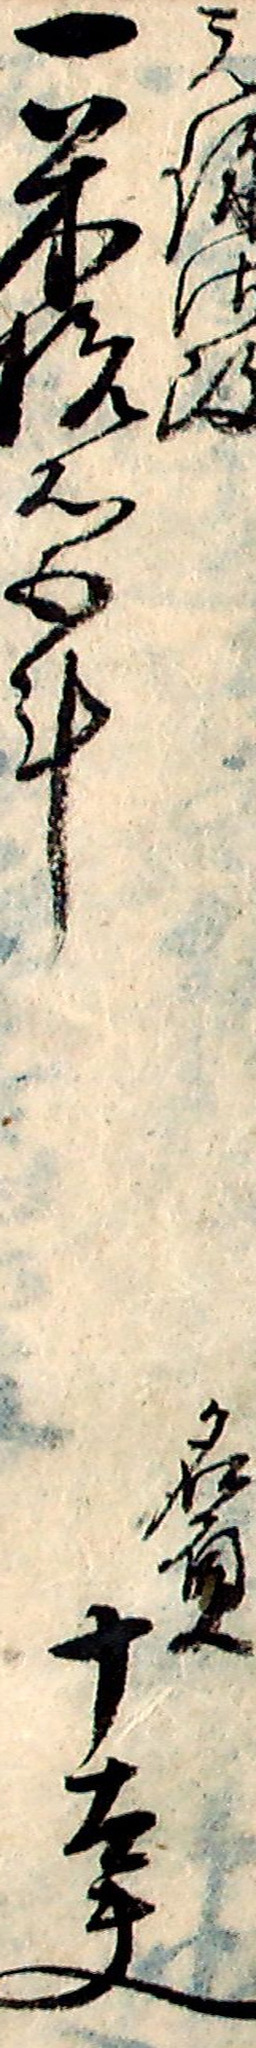一米拾石五斗十太夫

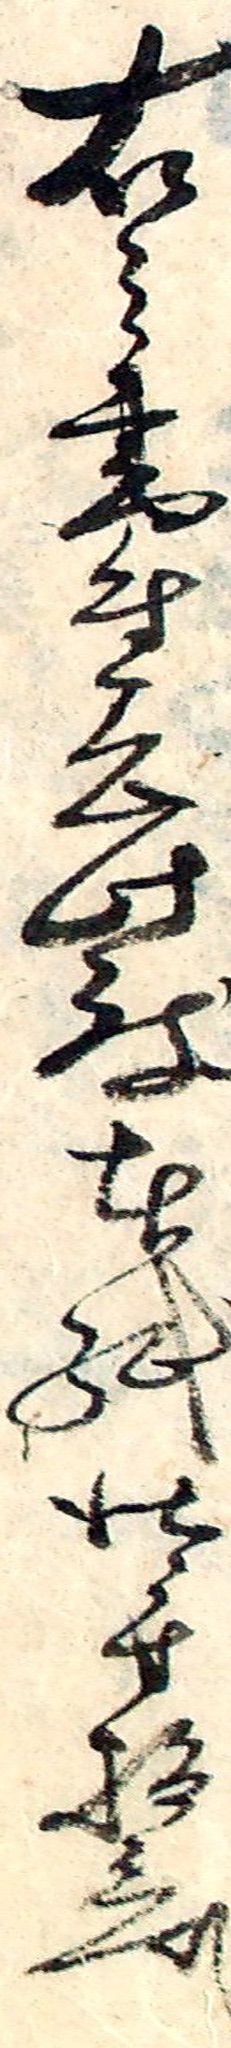右之書付は此度奉紙仕候付指上
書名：諸御願書控(後藤氏壱番）
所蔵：鳴門教育大学 Naruto University of Education
